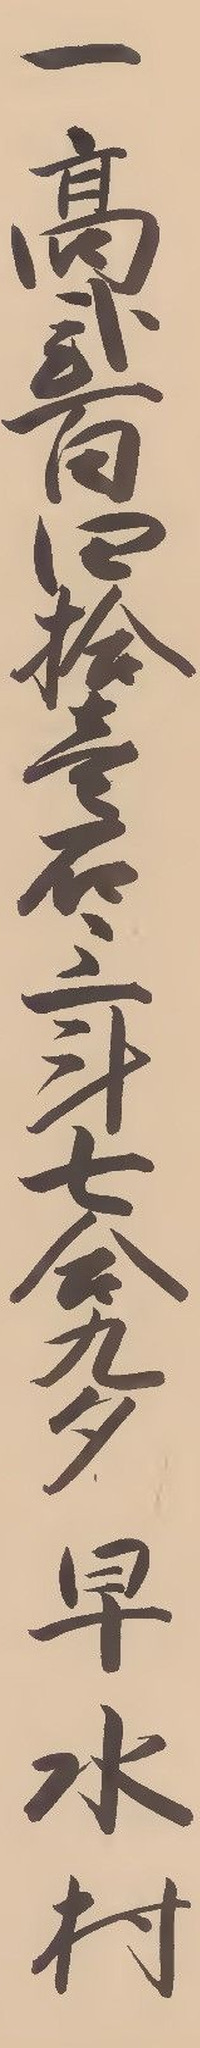一高弐百四拾壱石三斗七合九勺早水村
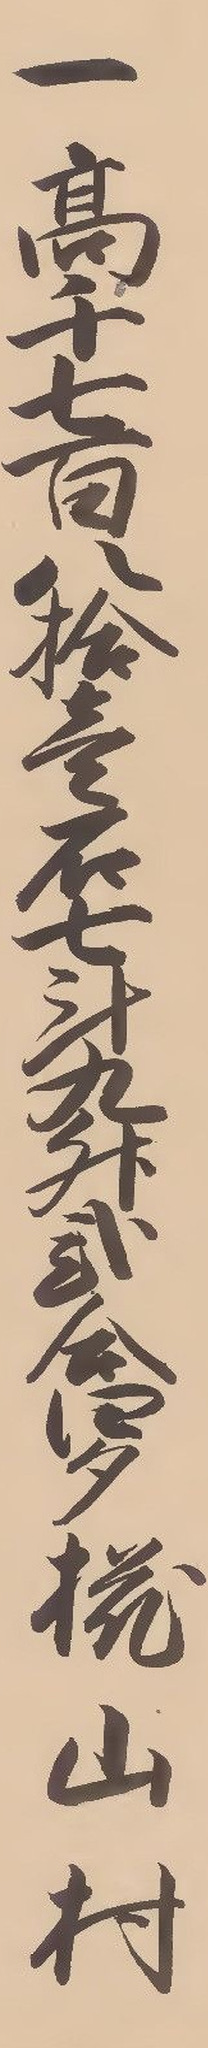一高千七百八拾壱石七斗九升弐合四勺樺山村
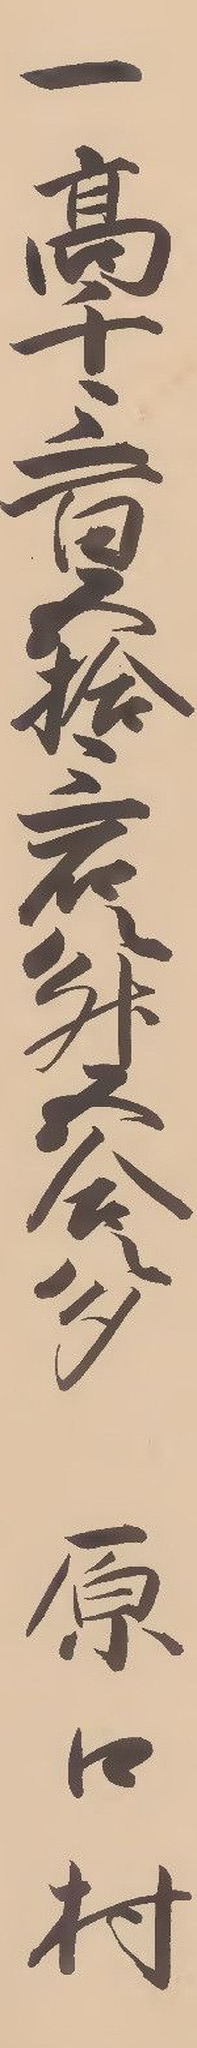一高千三百五拾三石八升五合八勺原口村
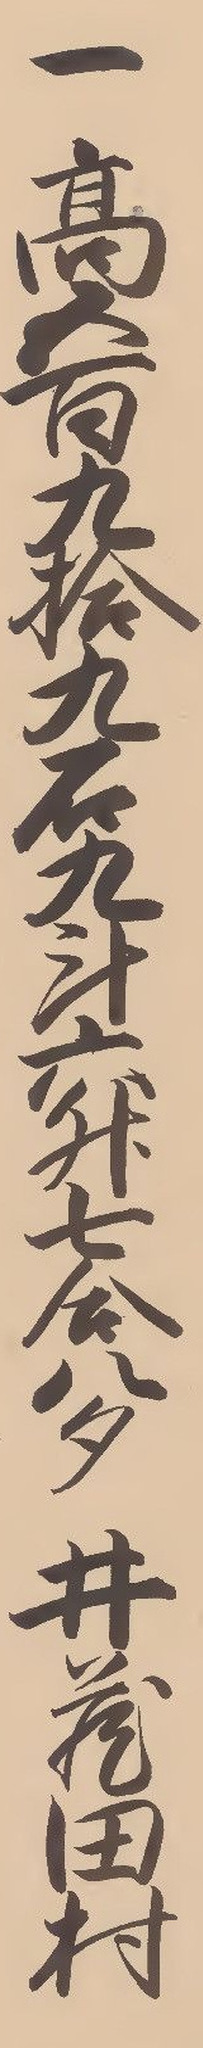一高五百九拾九石九斗六升七合八勺井蔵田村
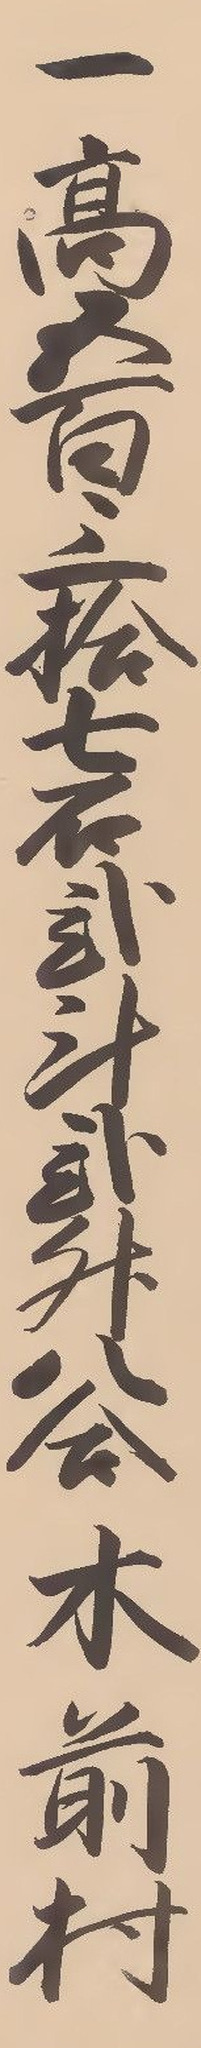一高五百三拾七石弐斗弐升八合木前村
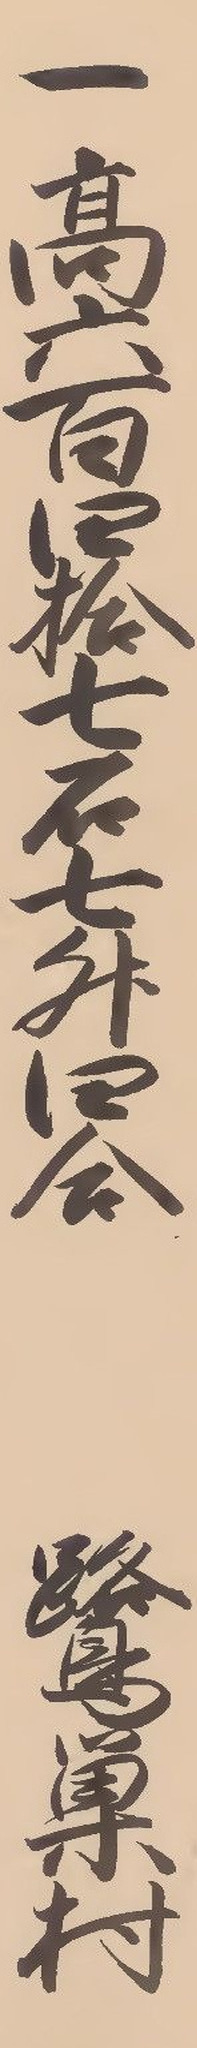一高六百四拾七石七升四合鷺巣村
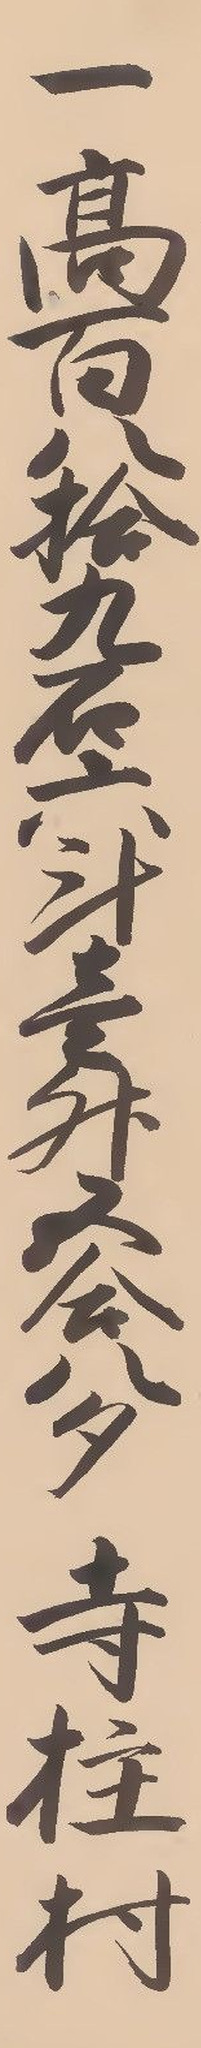一高百八拾九石六斗壱升五合八勺寺柱村
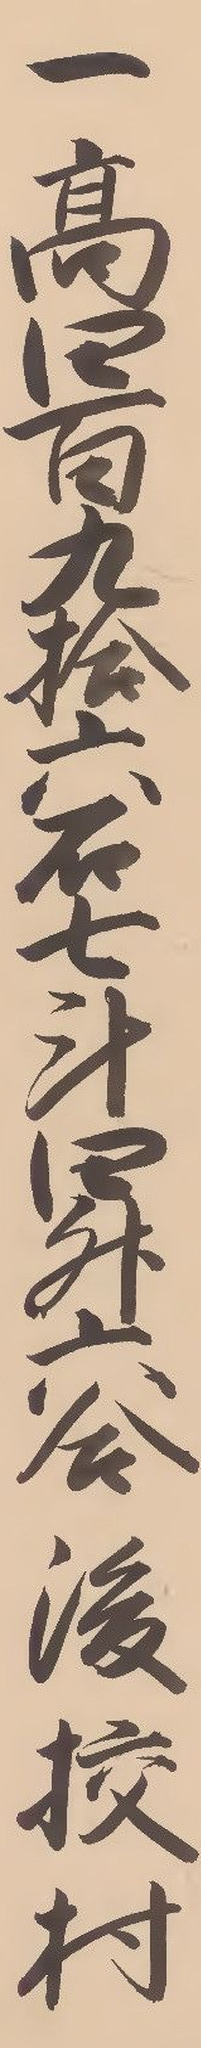一高四百九拾六石七斗四升六合後挍村

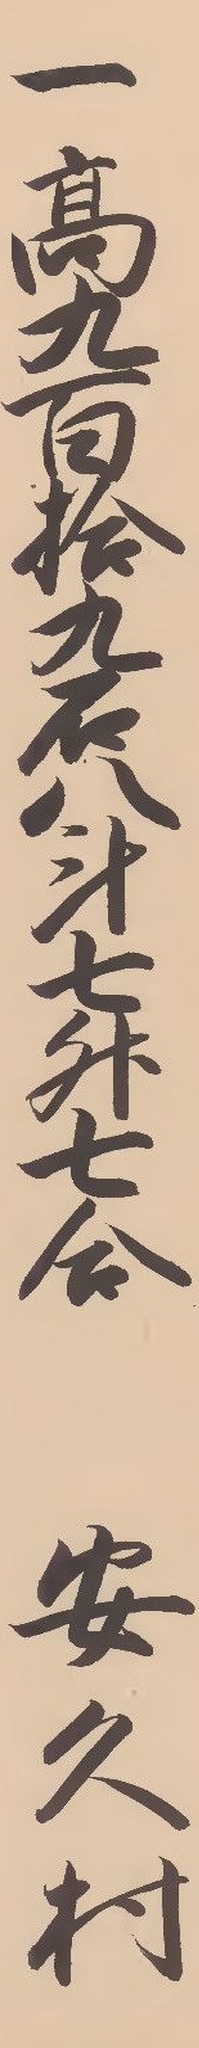一高九百拾九石八斗七升七合安久村
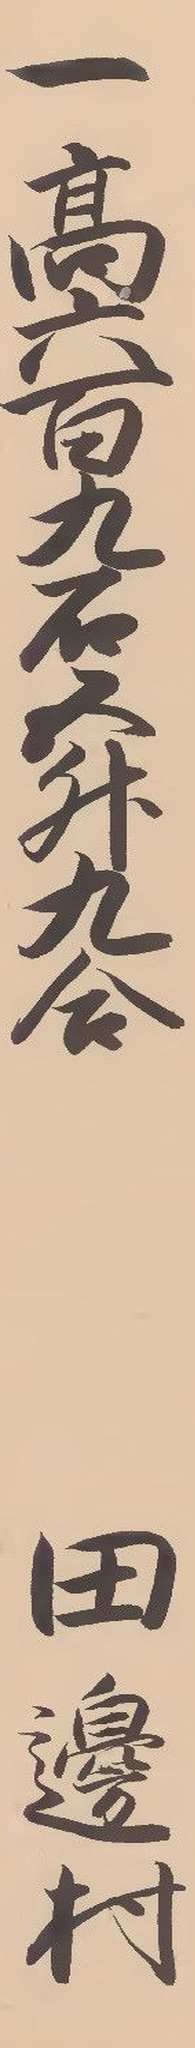一高六百九石五升九合田辺村
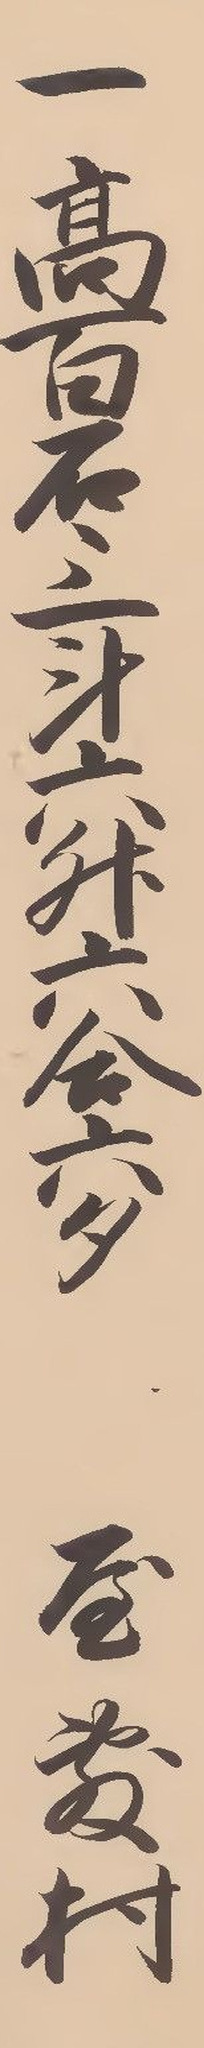一高百石三斗六升六合六勺屋敷村
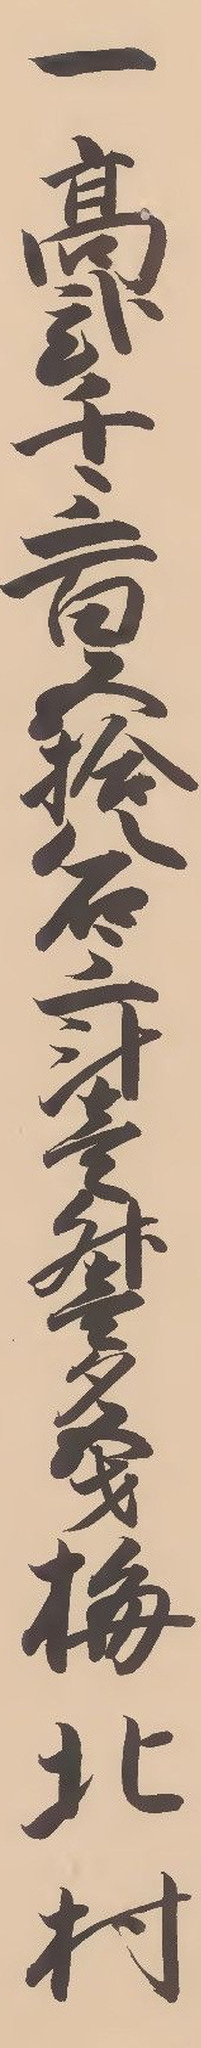一高弐千三百五拾八石三斗壱升壱勺五才梅北村
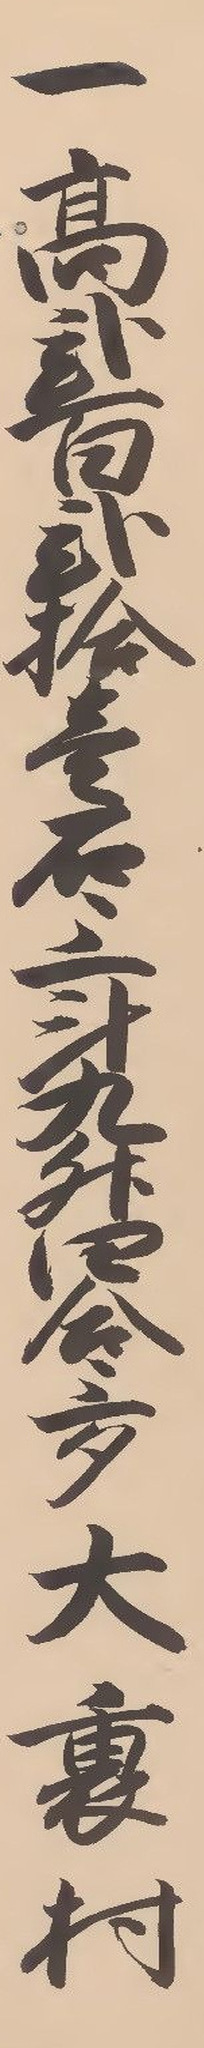一高弐百弐拾壱石三斗九升四合三勺大裏村
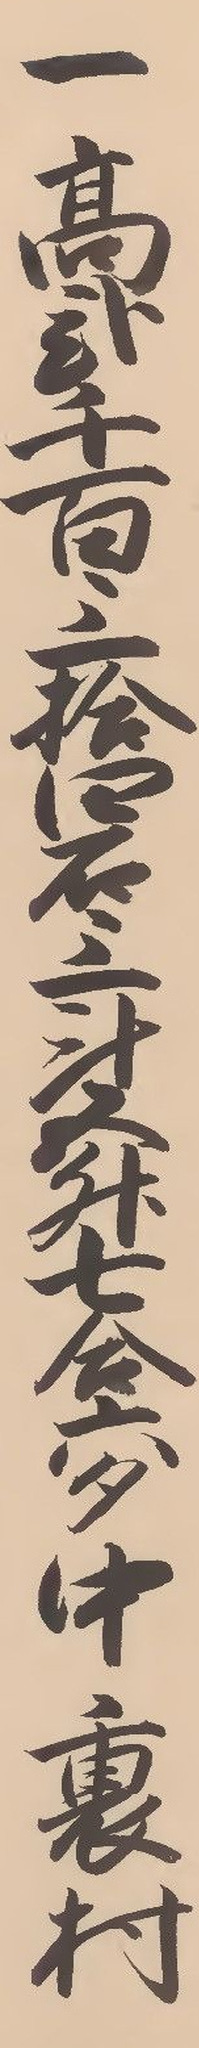一高弐千百三拾四石三斗五升七合六勺中裏村
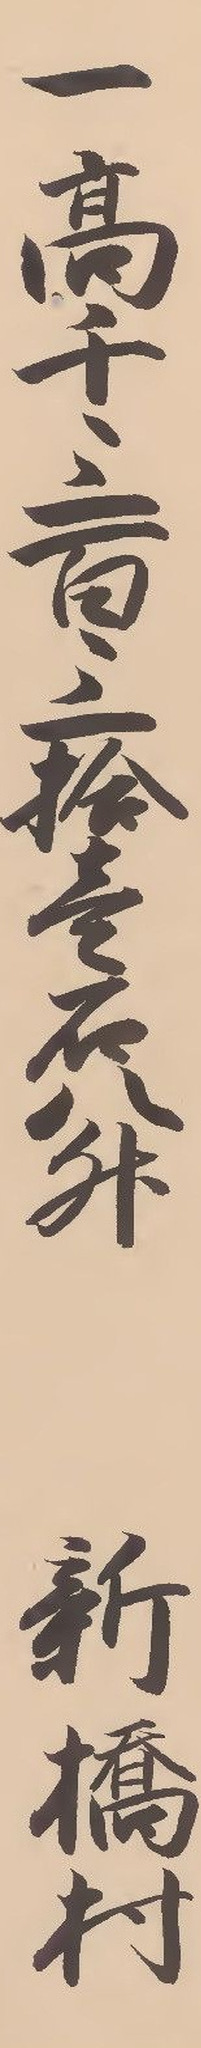一高千三百三拾壱石八升新橋村
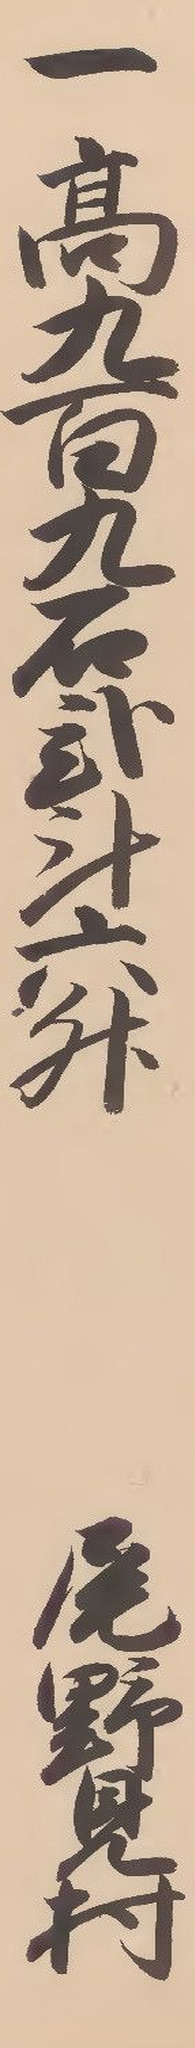一高九百九石弐斗六升尾野見村
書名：日向国郷帳
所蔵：国立公文書館 National Archives of Japan
